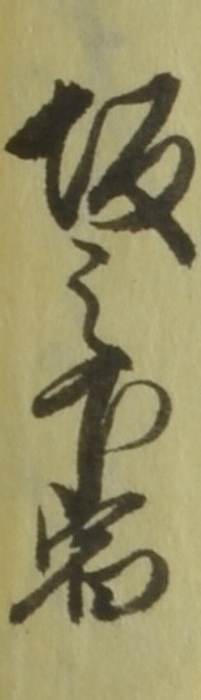坂之下宿
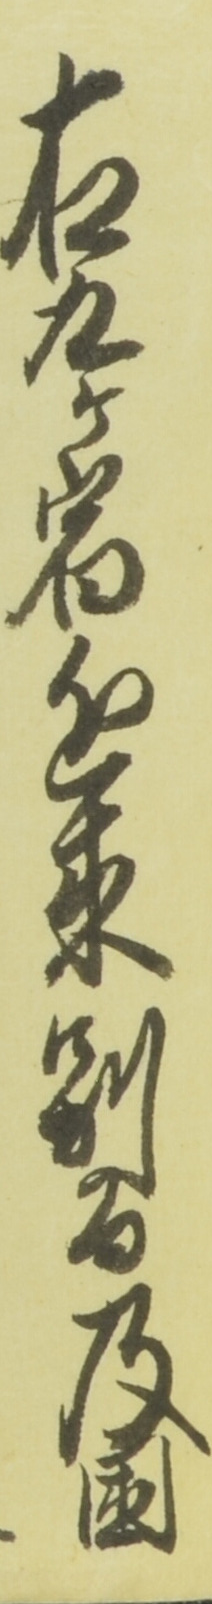右九ヶ宿近来別而及困
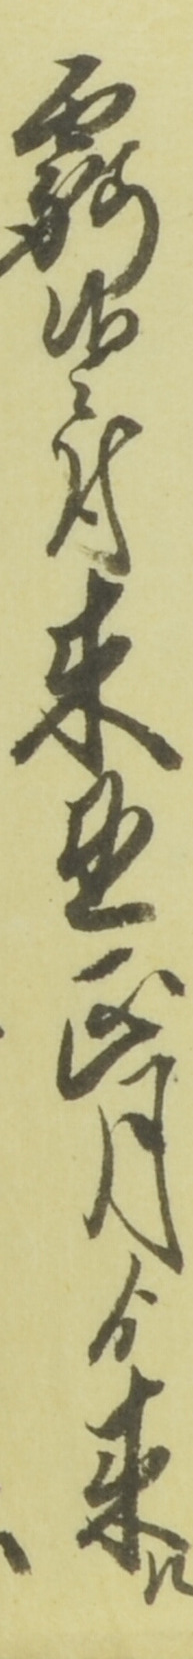窮候ニ付来丑正月ゟ来ル
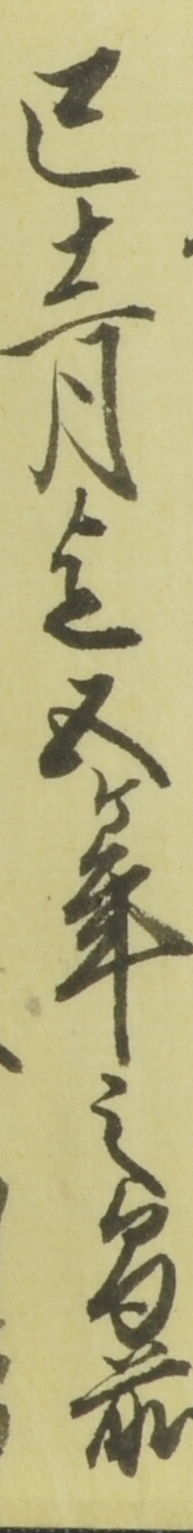巳十二月迄五ヶ年之間前
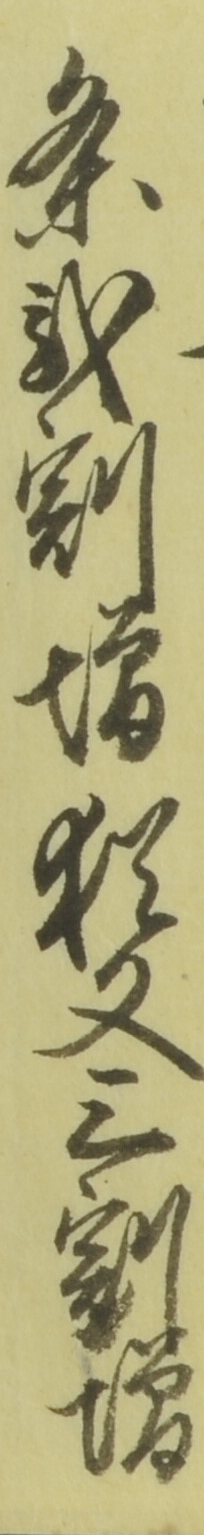条二割増猶三割増
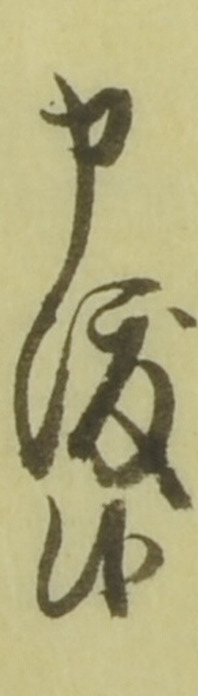申渡候
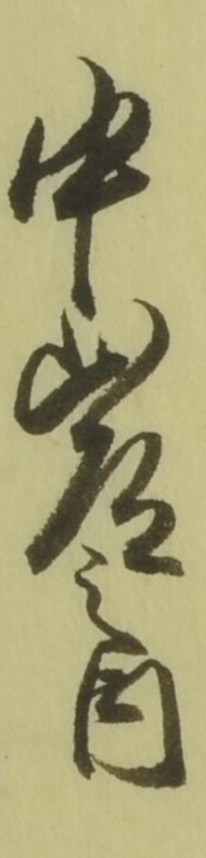中山道之内
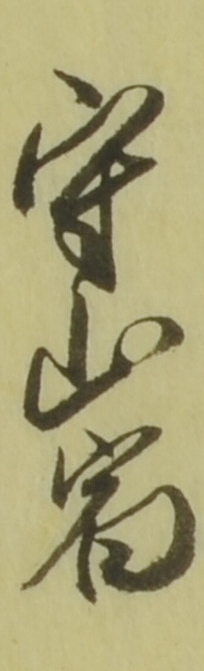守山宿
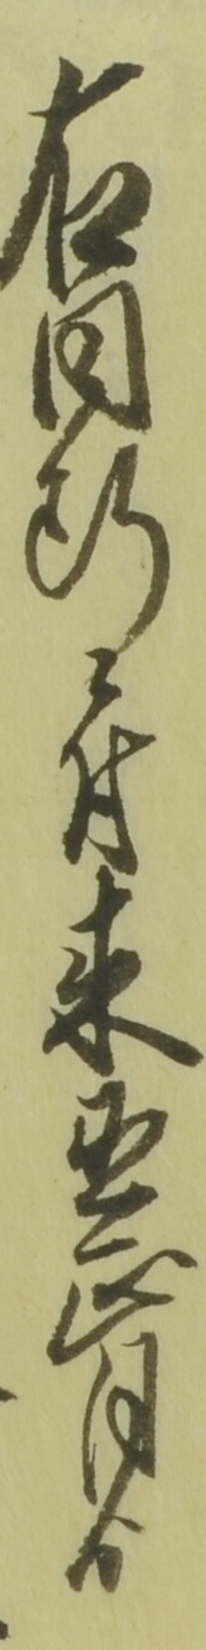右同断ニ付来丑正月ゟ
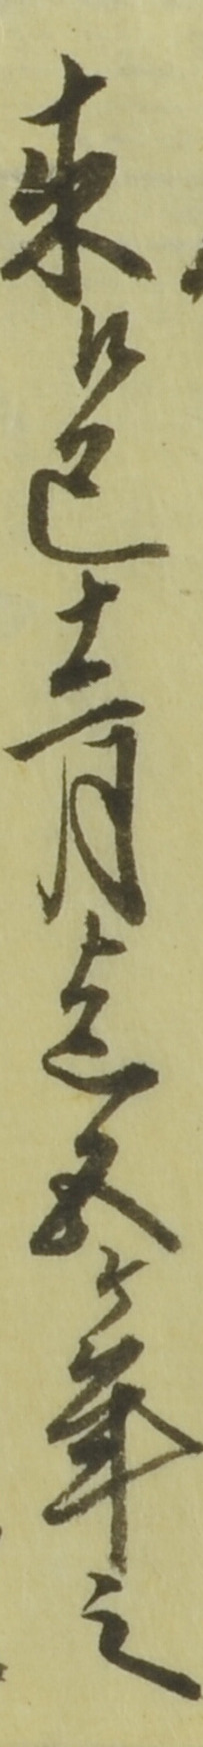来ル巳十二月迄五ヶ年之
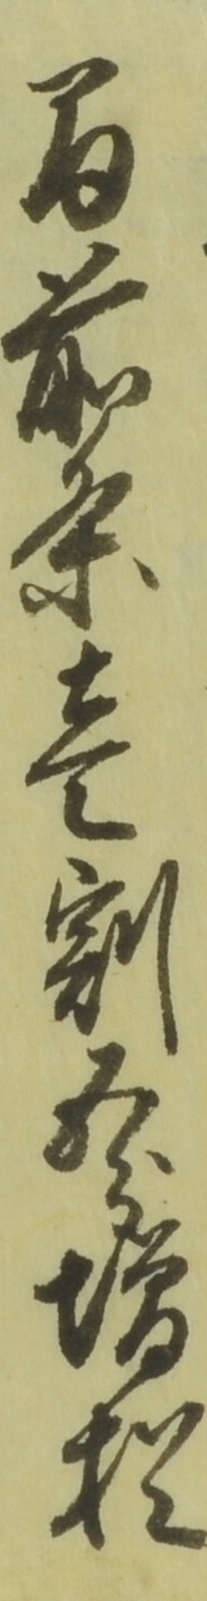間前条壱割五分増猶
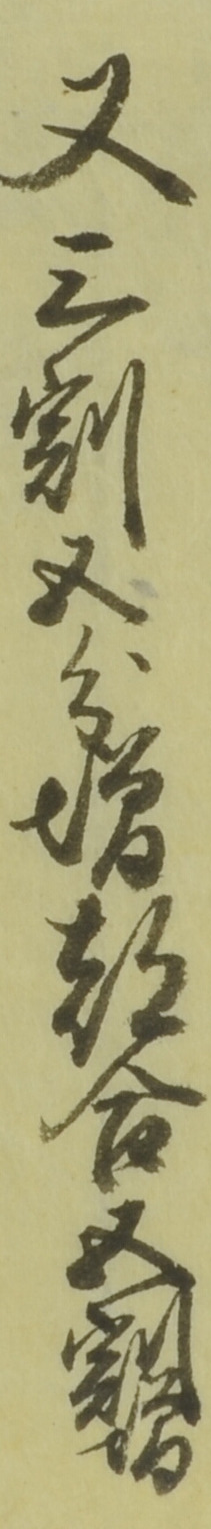又三割五分増都合五割増
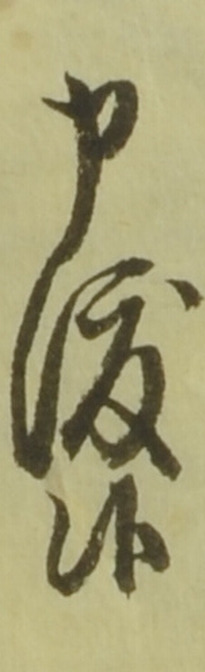申渡候
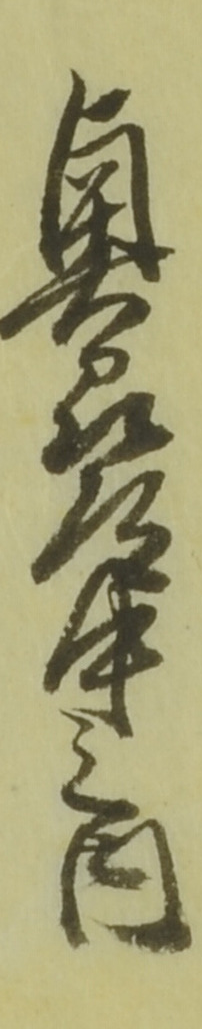奥州道中之内
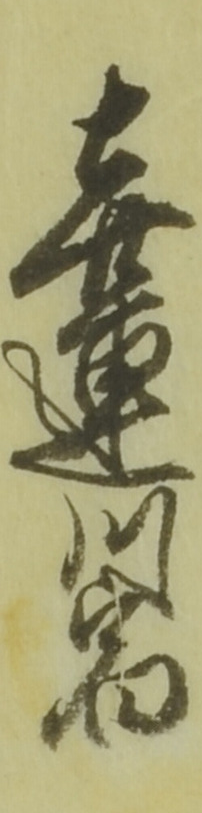喜連川宿
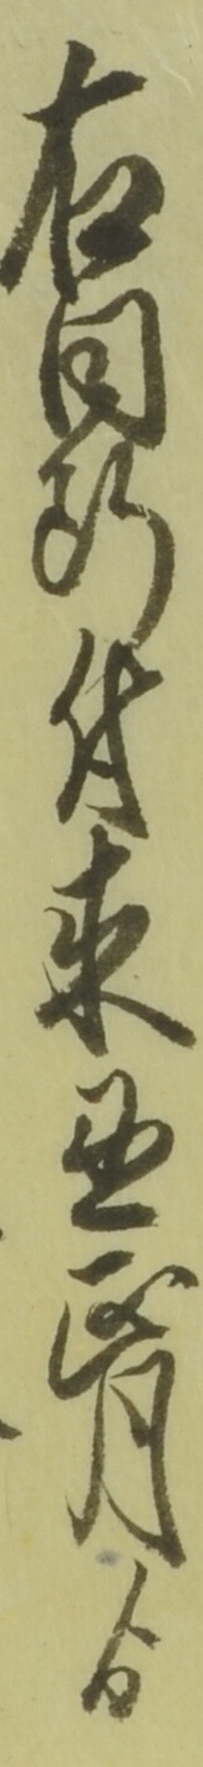右同断付来丑正月ゟ
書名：御触書御書附控
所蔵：伊那市立高遠町図書館・合同会社AMANE
